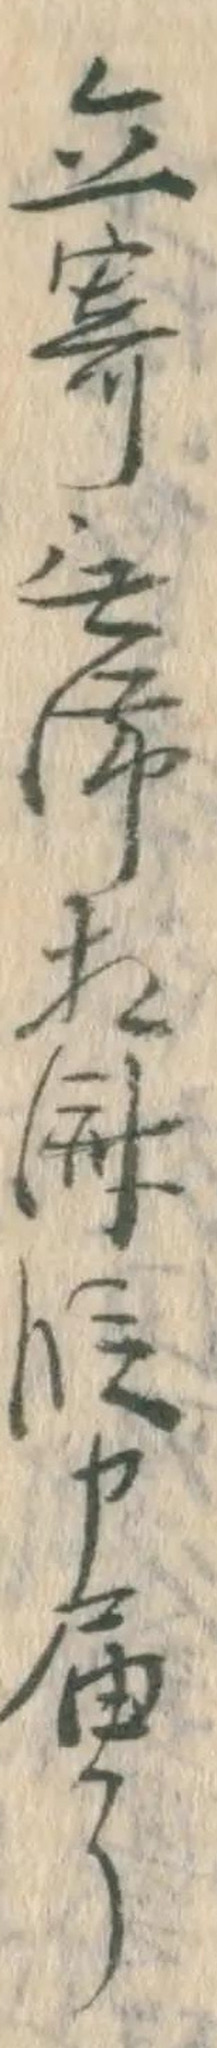立寄無滞相済段申届了
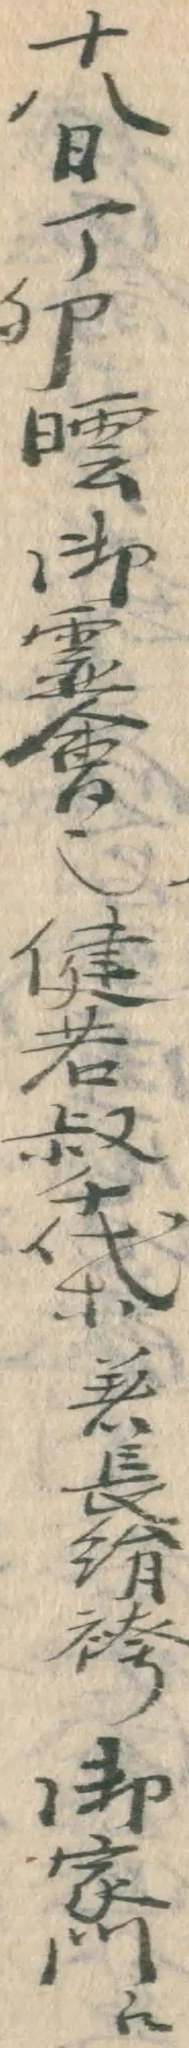十八日丁卯曇御霊會也健若叔千代等着長絹袴御家門え
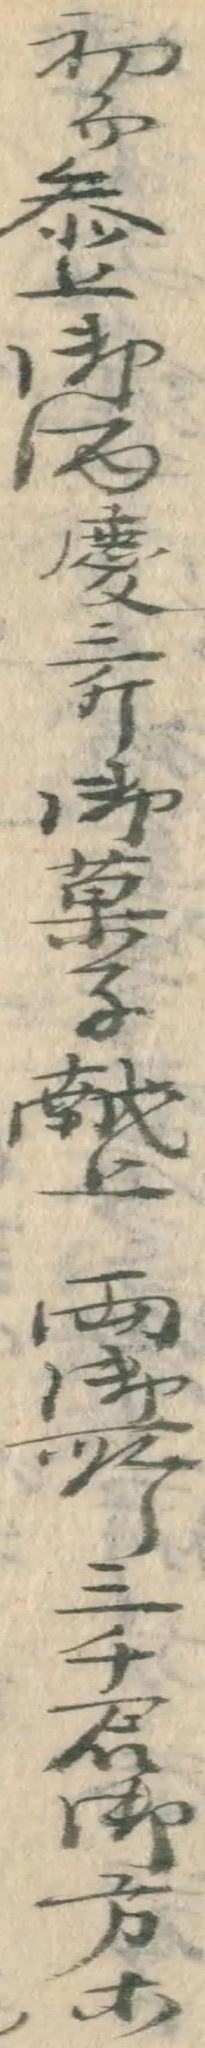初而参上御酒慶三升御菓子献上両御所し三千君御方等
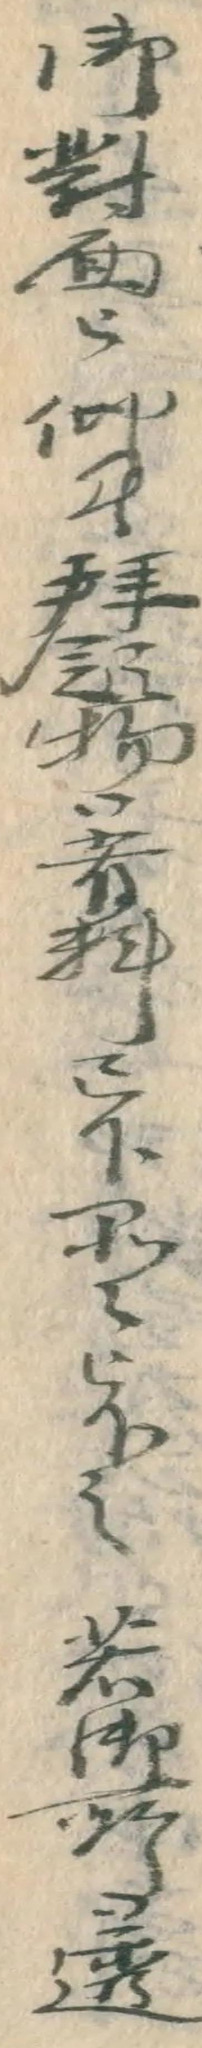御對面被仰付拝領物御肴料被下品々被下之若御所御透

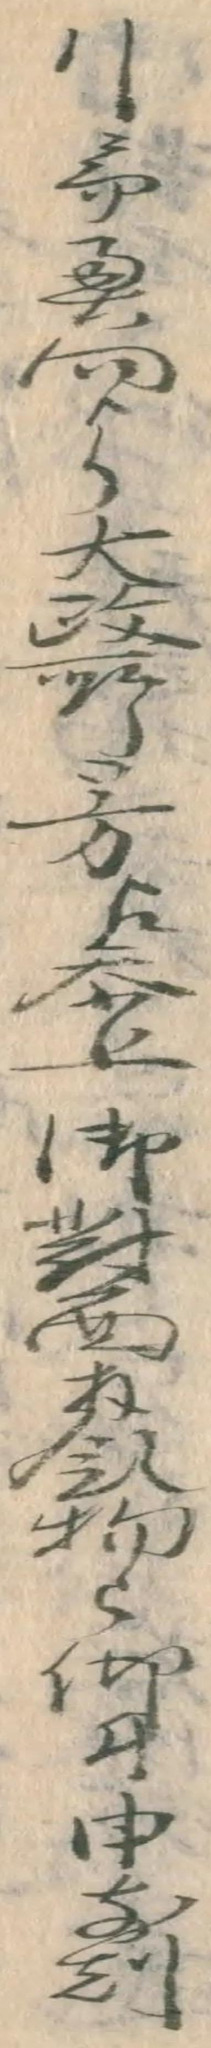引ニ而奥向より大政所之方参上御對面拝領物被仰付申前刻
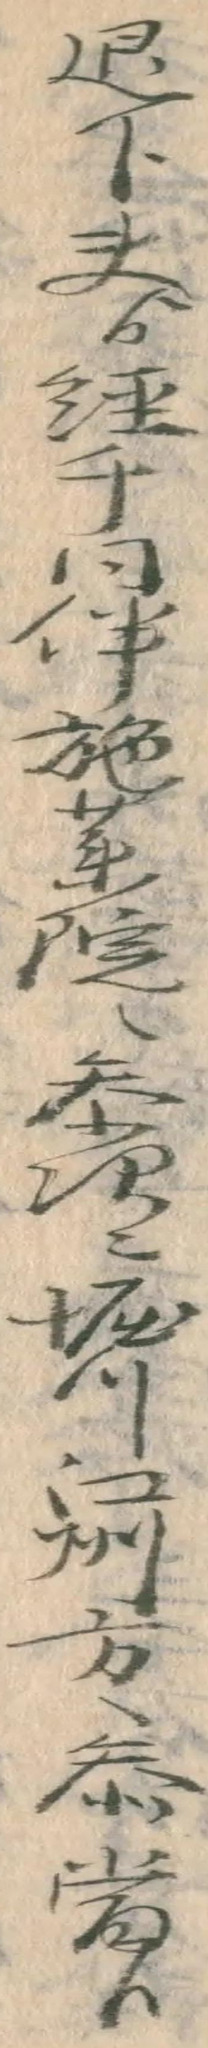退下夫ゟ経干同伴施薬院へ参次ニ堀川江州方へ参當候
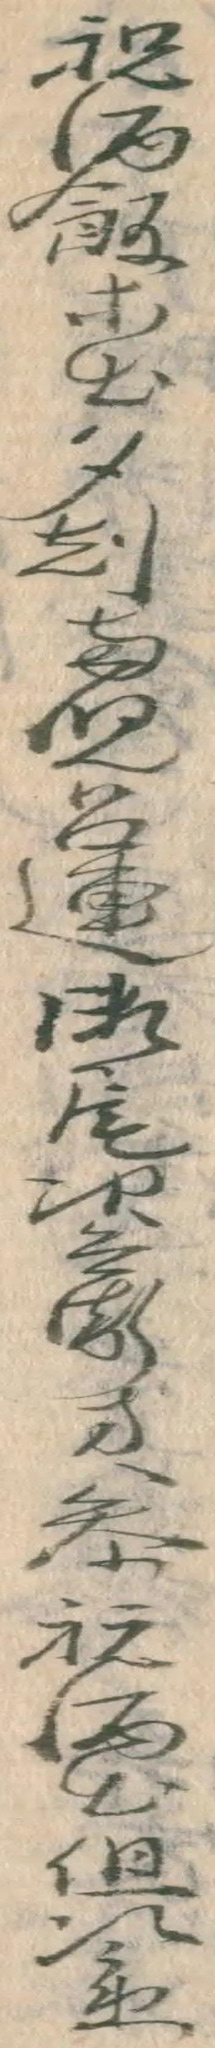祝酒飯等出夕刻両児召連御尾次兵衛方へ参祝酒出但次郎
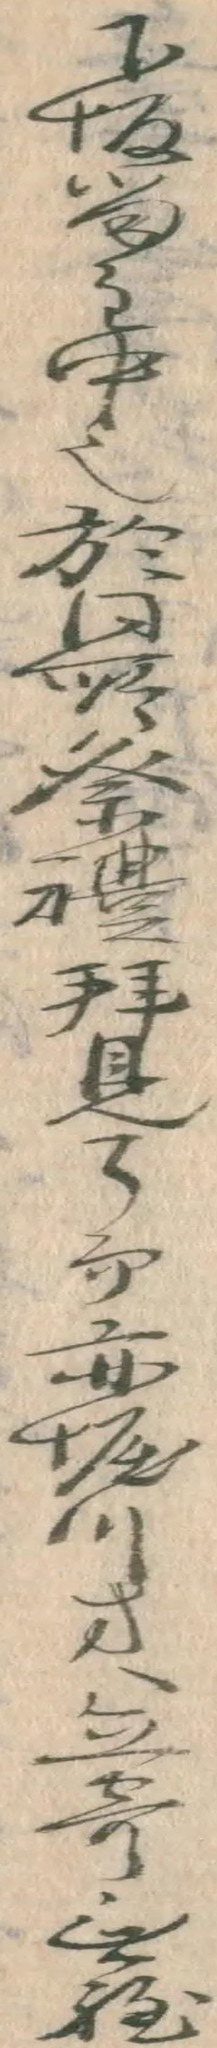下坂留主中也於同所祭禮拝見了而亦堀川方へ立寄無程
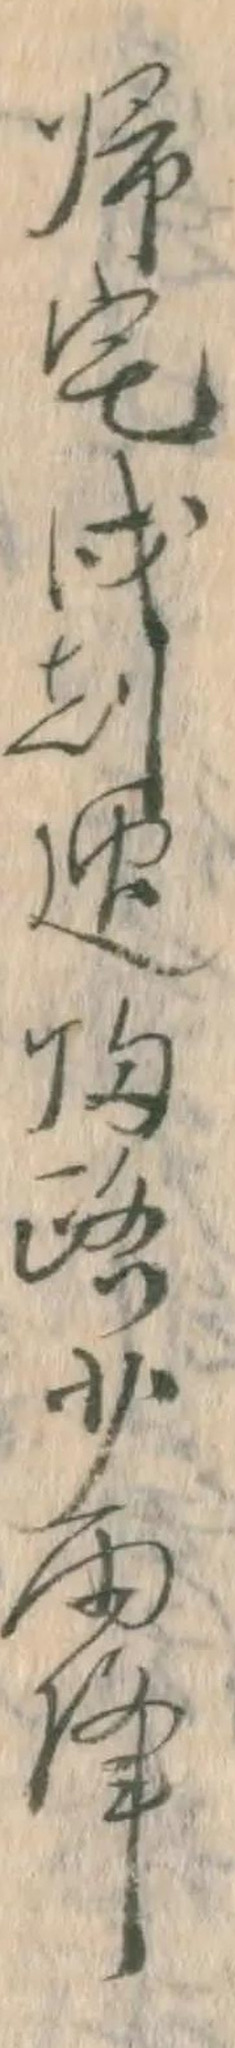帰宅戌刻過帰路少雨降
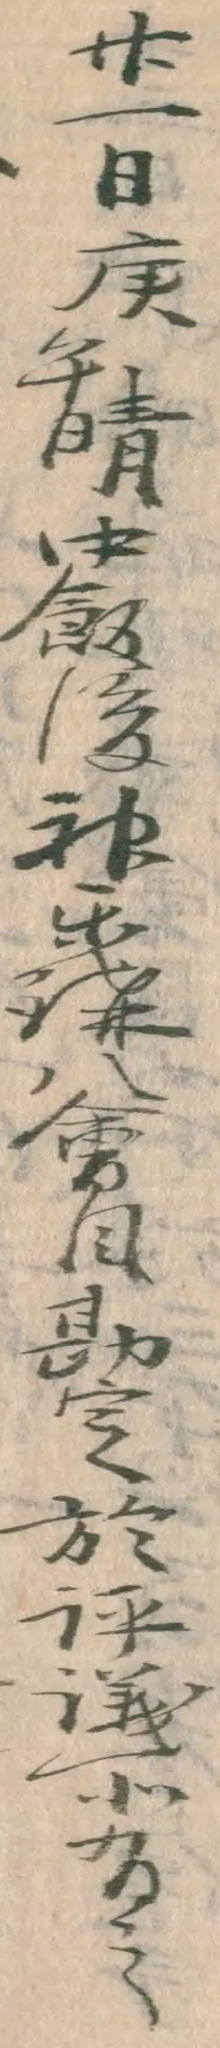廿一日庚午晴中飯後神楽講八會目勘定於評議所有之
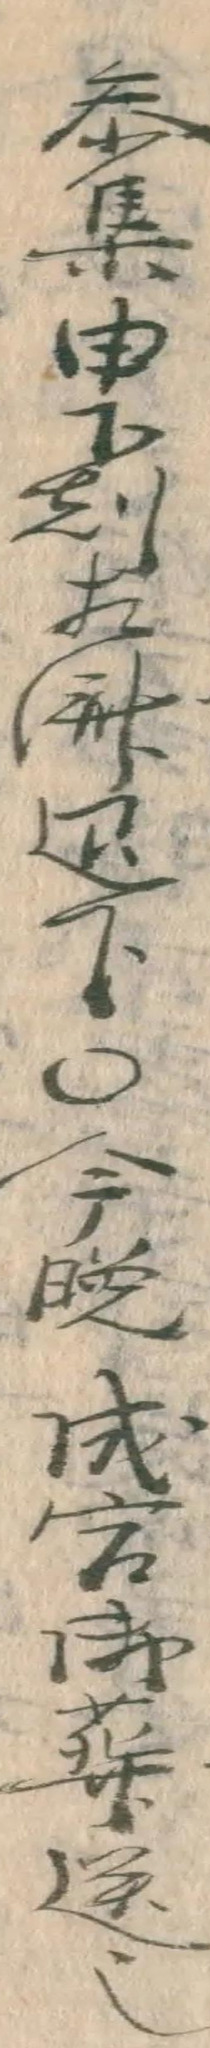参集申下刻相済退下〇今晩成宮御葬送也
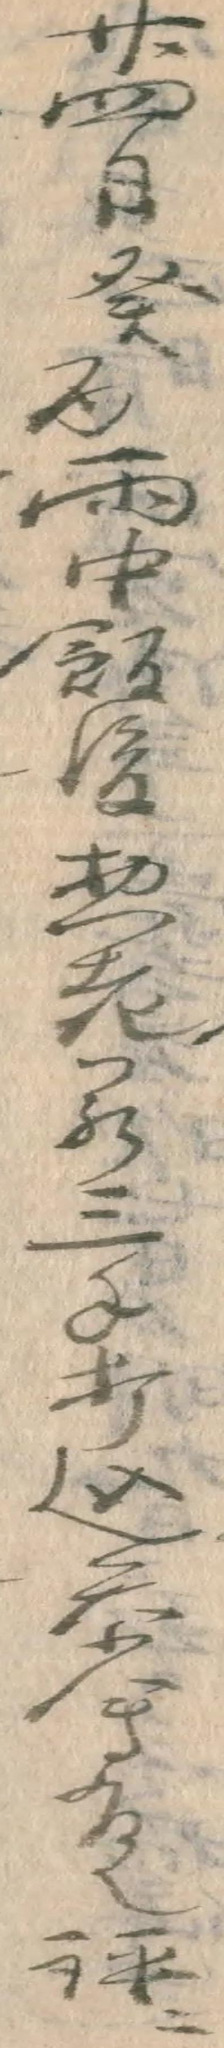廿四日癸酉雨中飯後惣老若三手打込参會有之評ニ
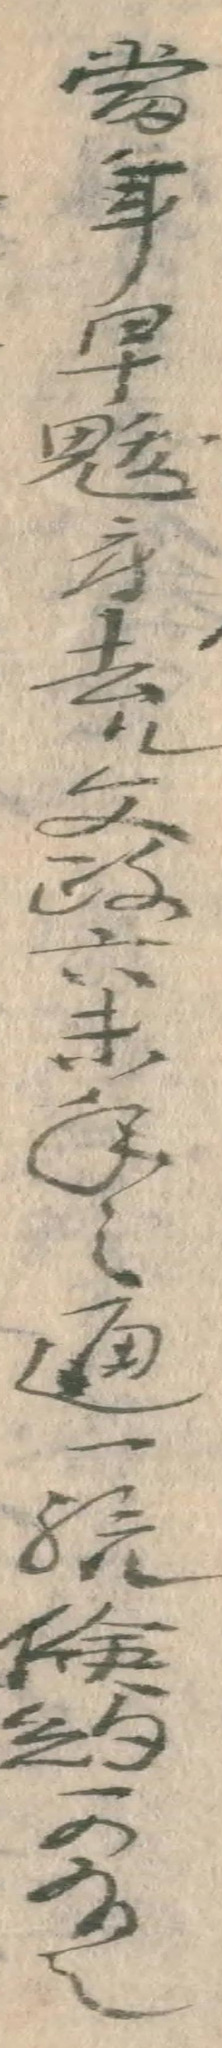當年旱魃ニ付去ル文政六未年之通一統倹約可有之
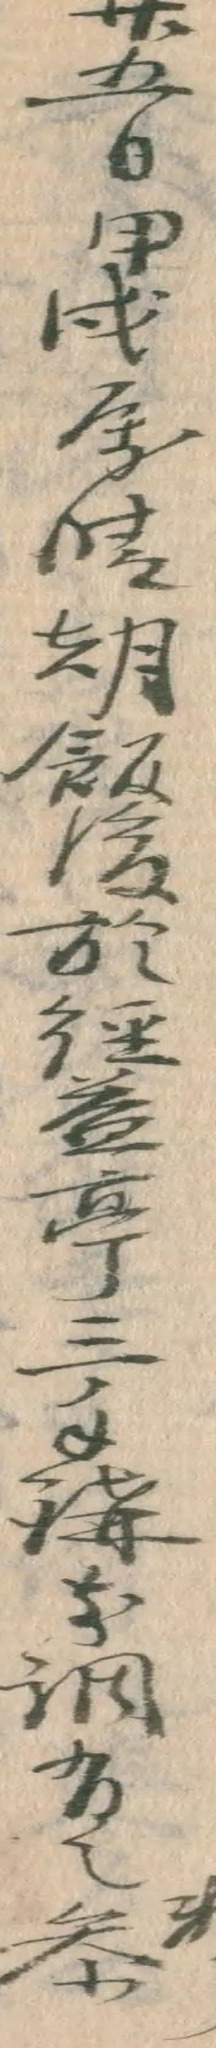廿五日甲戌晴朝飯後於経益亭三手講支調有之参
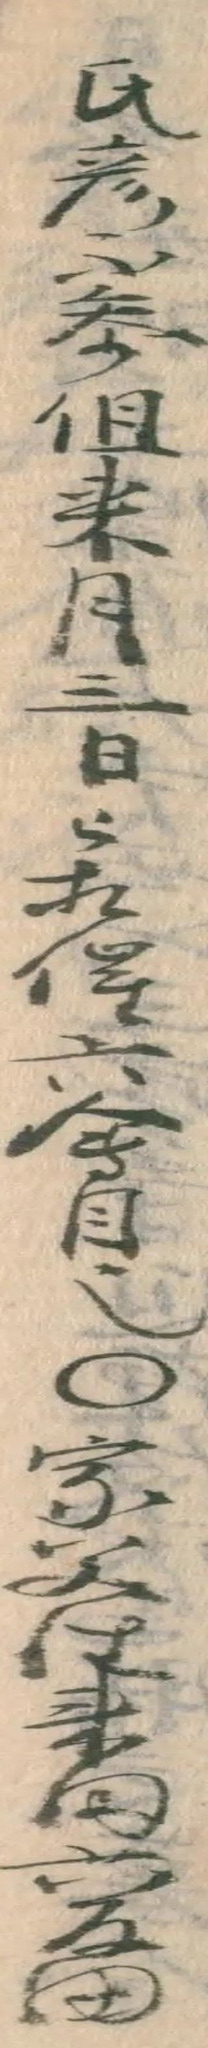氏彦不参但来月三日被相催六會目也○家父往来田六反田
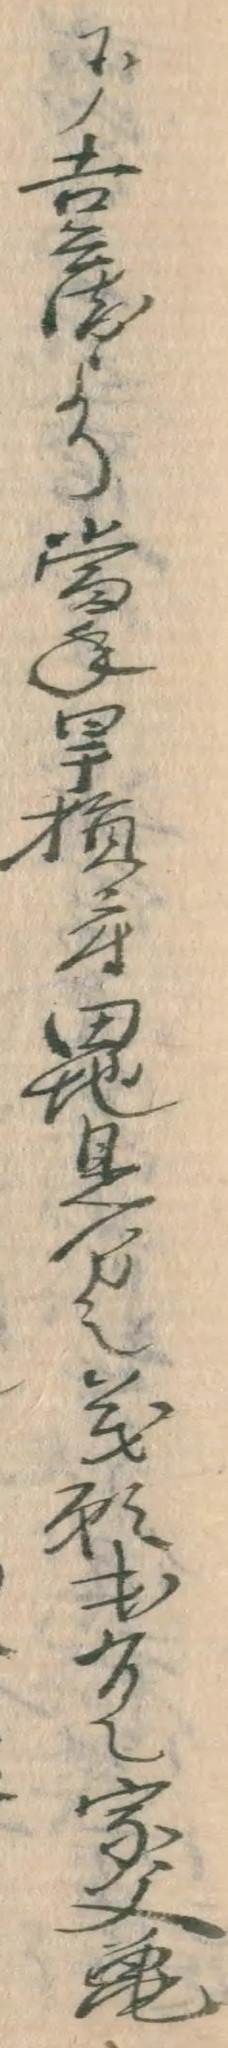下ノ吉兵衛より當年旱損ニ付田地見分之義願本有之家父亀
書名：賀茂社記録. 第65冊
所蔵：国立国会図書館 National Diet Library, JAPAN
